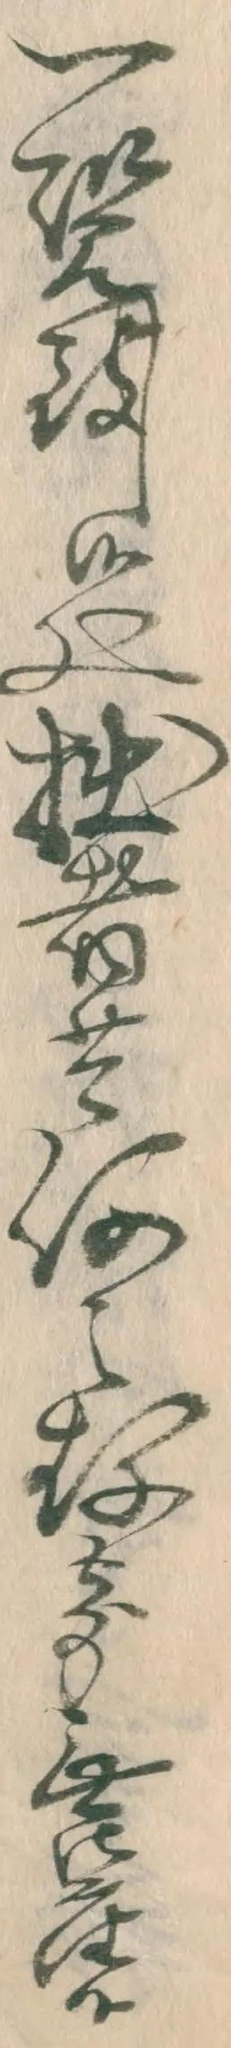一覧致し候処拙者共何之存寄も無御座候
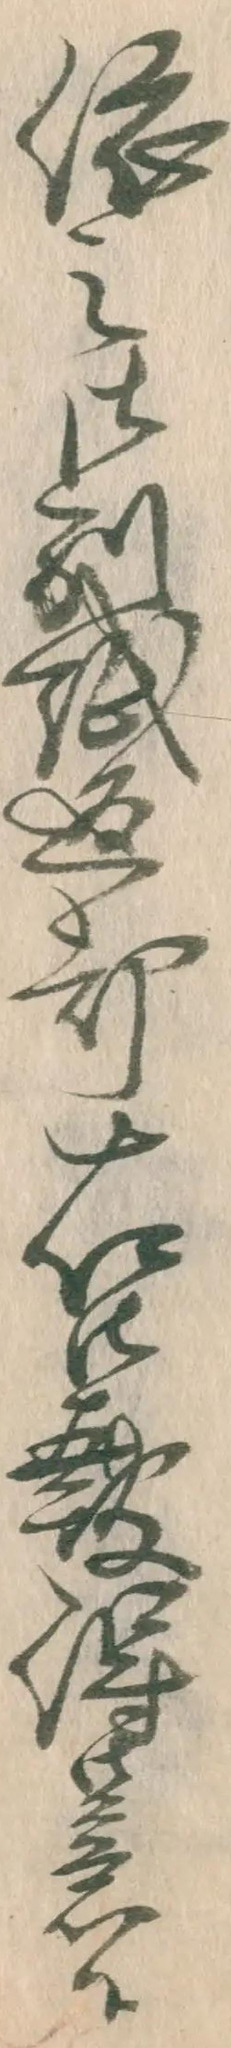依之御別紙返却右御報得御意候
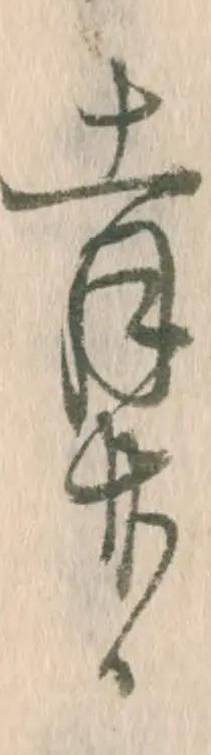十一月廿日
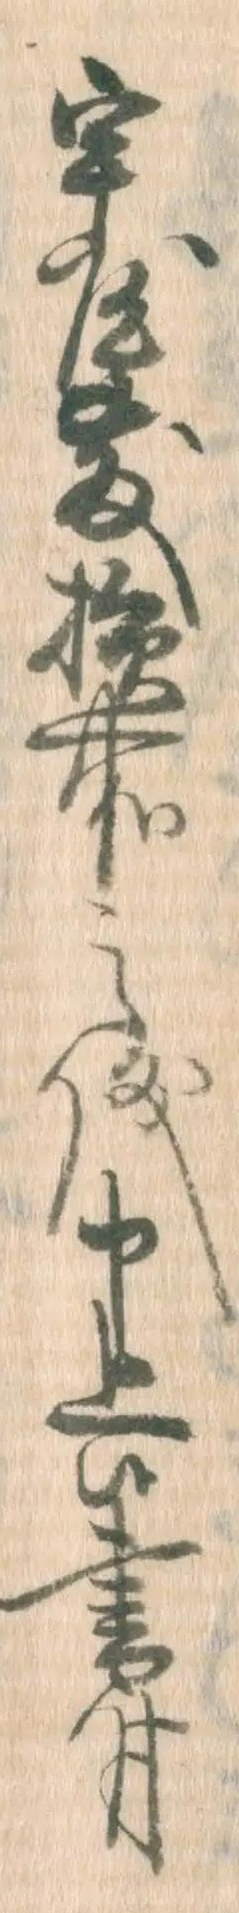│牢屋敷損所之儀申上候書付
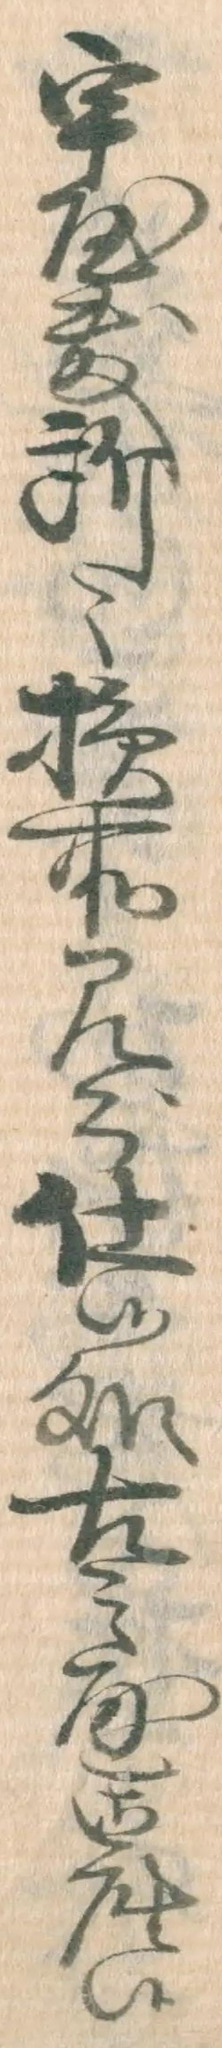牢屋敷所之損所見分仕候処左之通御座候
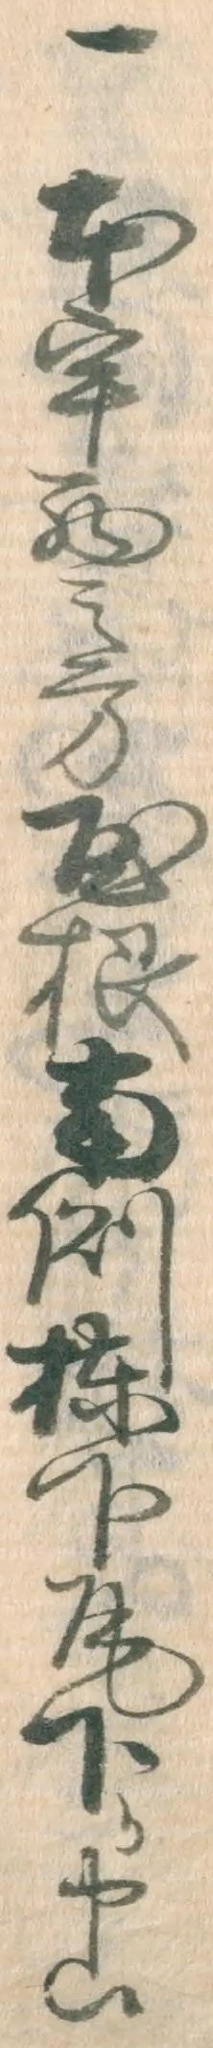一本牢西之方屋根南側棟下瓦下り申候

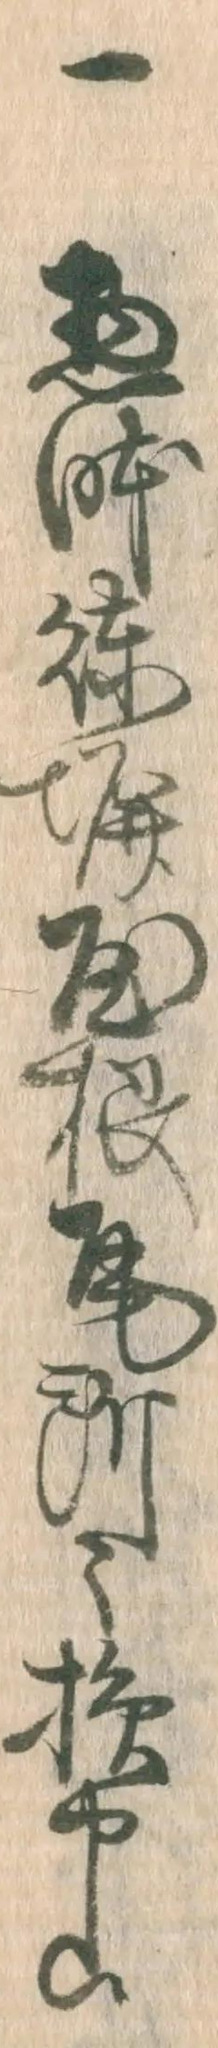一惣体煉塀屋根瓦所〻損申候
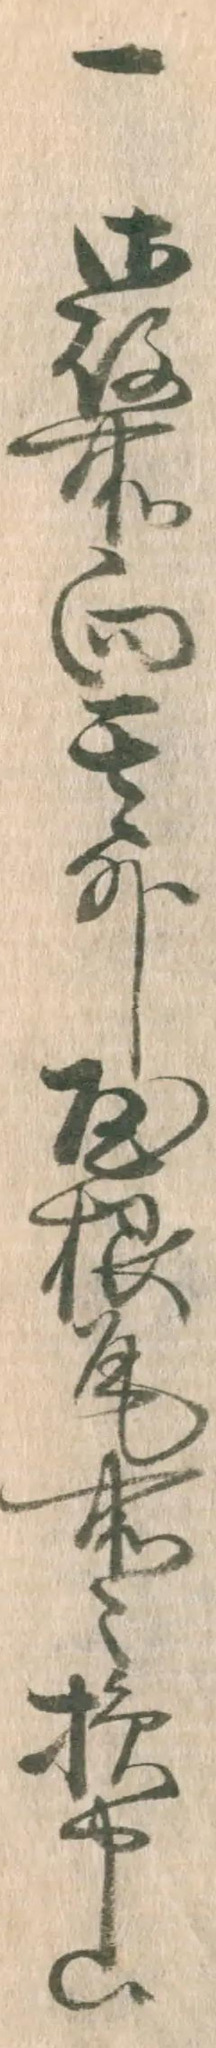一御役所向其外屋根瓦所〻損申候
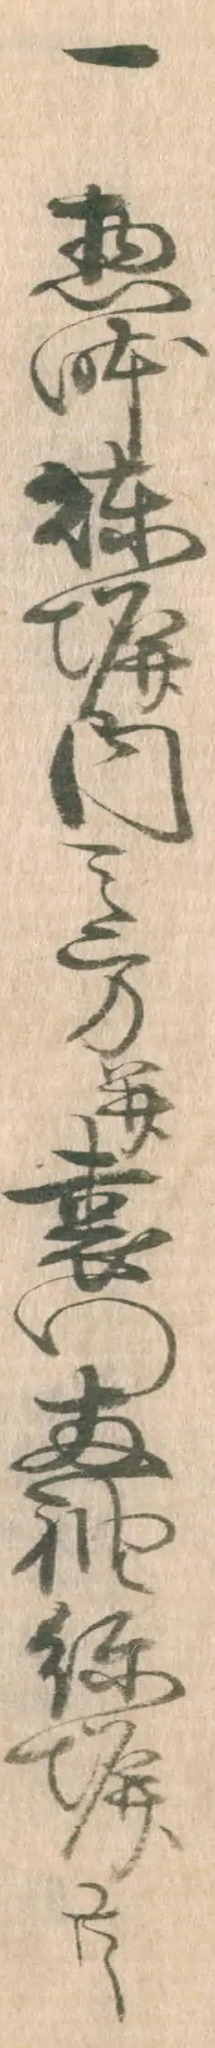一惣体煉塀内之方幷裏門両袖煉塀共
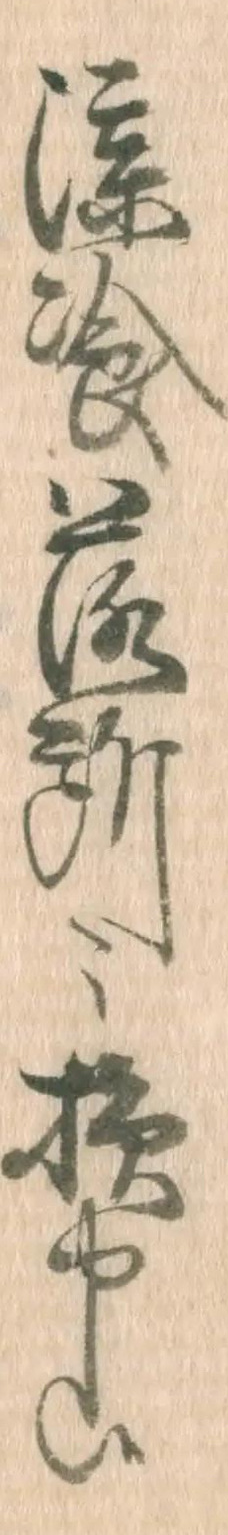漆喰落所〻損申候
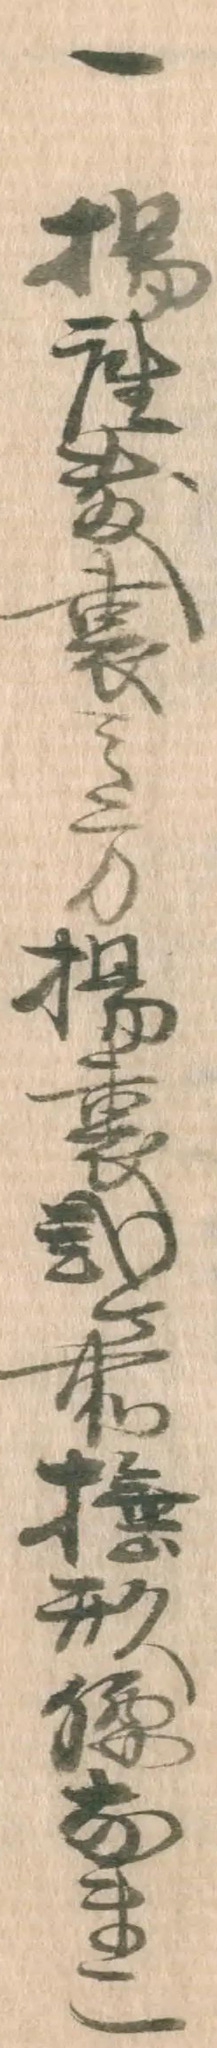一揚げ座敷裏之方揚裏弐ケ所棰形練なまこ
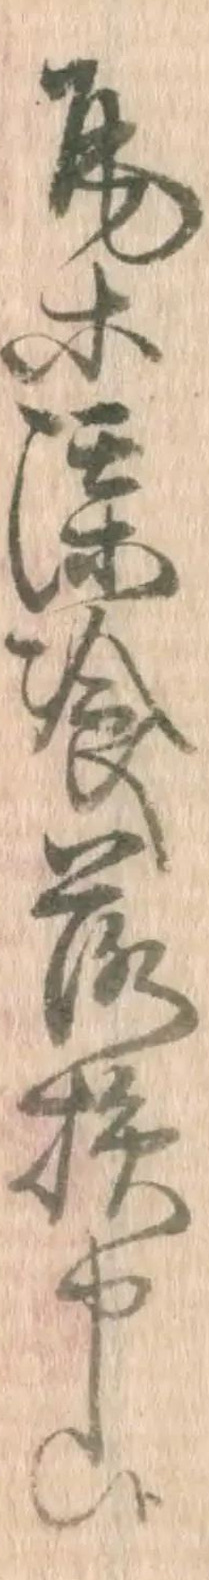瓦等漆喰落損申候
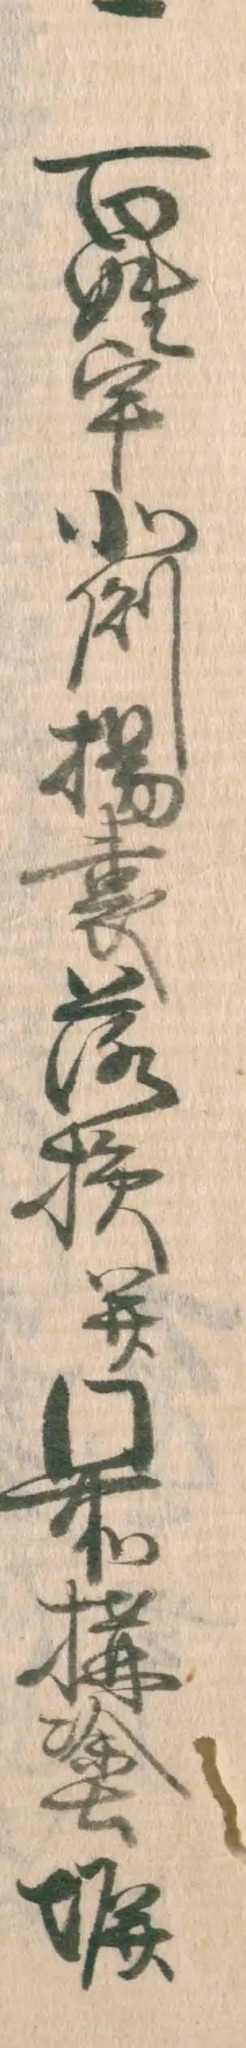一百姓牢北側揚裏落損幷同所構塗塀
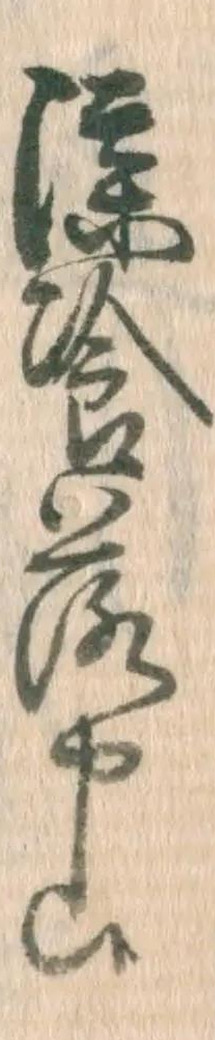漆喰落申候
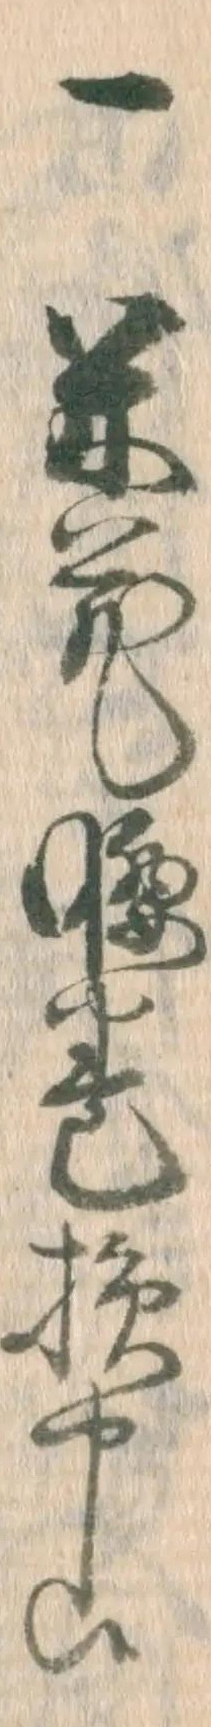一米蔵腰巻損申候
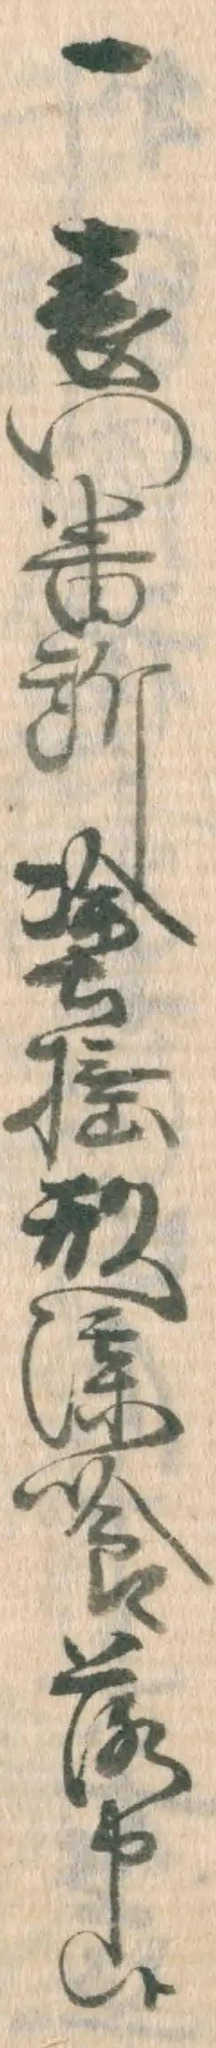一表門番所塗棰形漆喰落申候
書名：七十冊物類集 71巻. [44] 四十三 牢屋敷御普請御修覆地震ニ付骨折候牢屋掛御褒美之部
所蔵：国立国会図書館 National Diet Library, JAPAN
